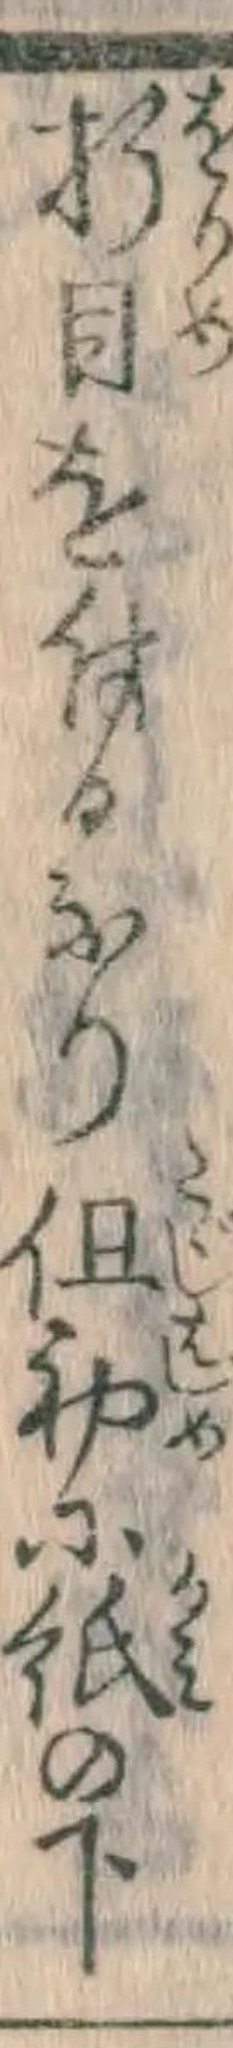折目を付るなり但初に紙の下
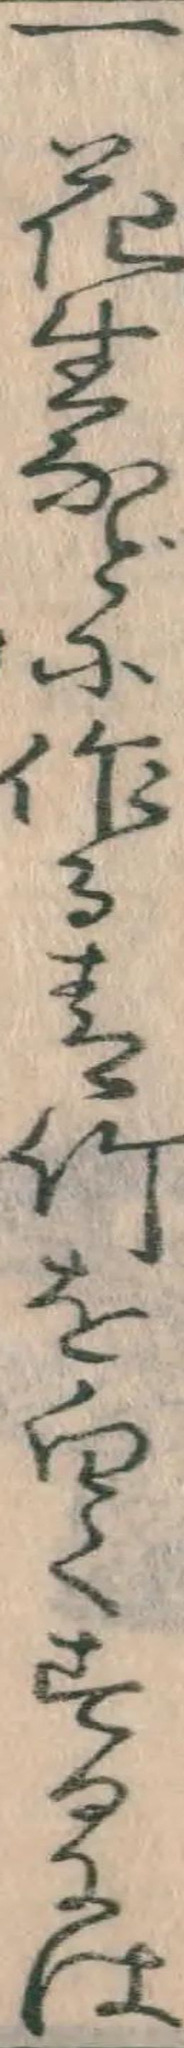一花生などに作る青竹を白くするには
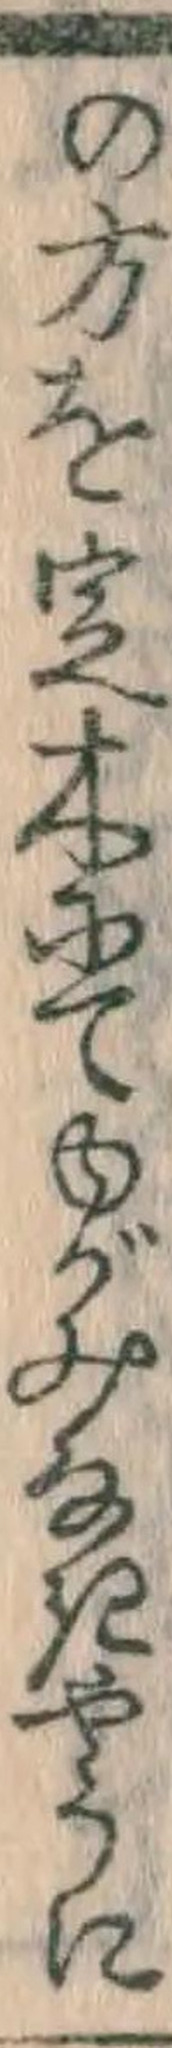の方を定木にてゆがみなきやうに
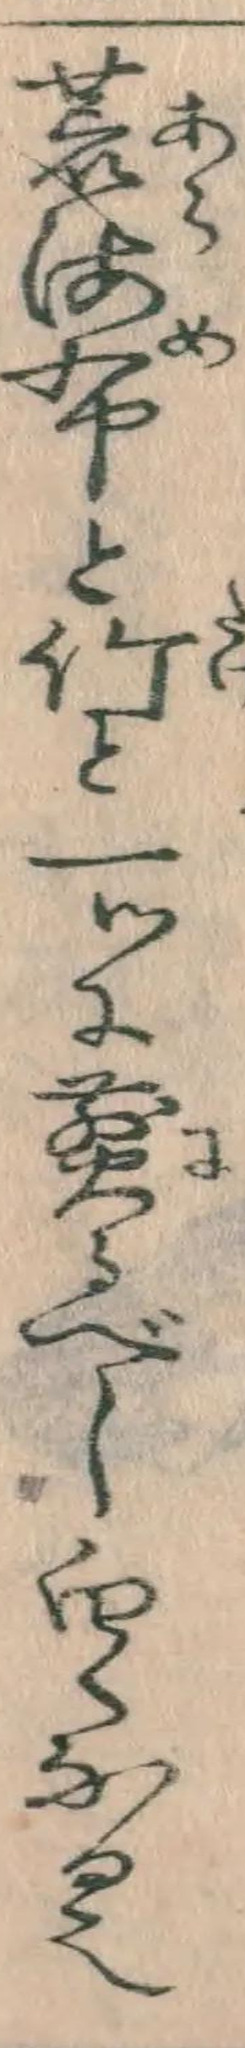荒海布と竹と一ッに煎るべし白くなる也
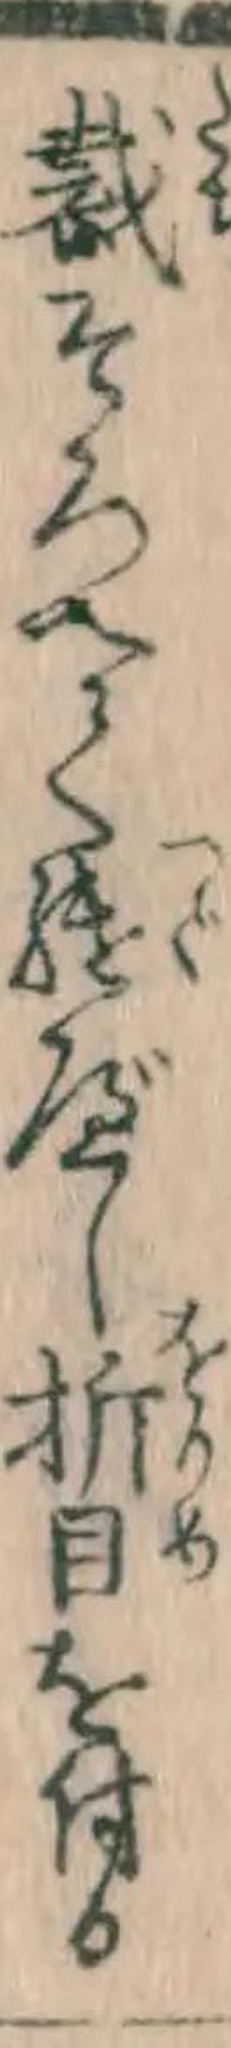裁そろへて継べし折目を付る
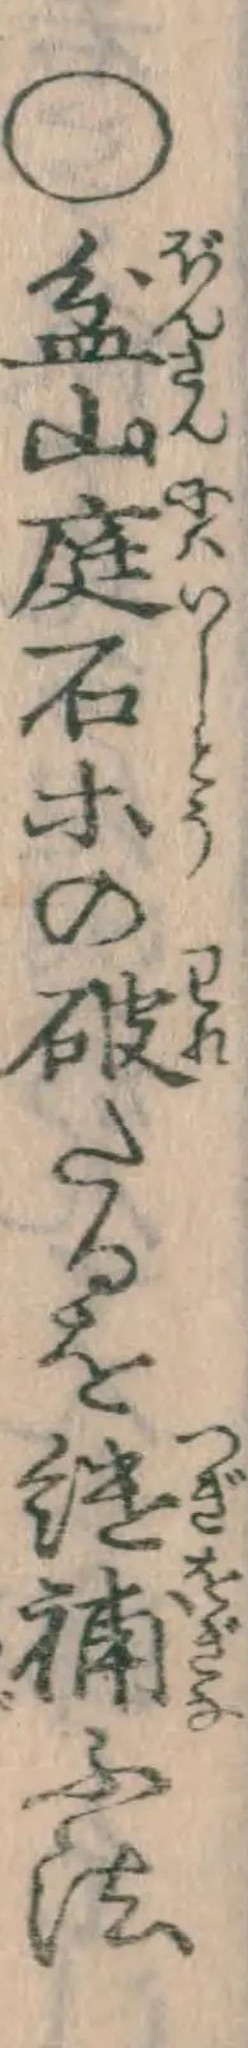○盆山庭石等の破たるを継補ふ法
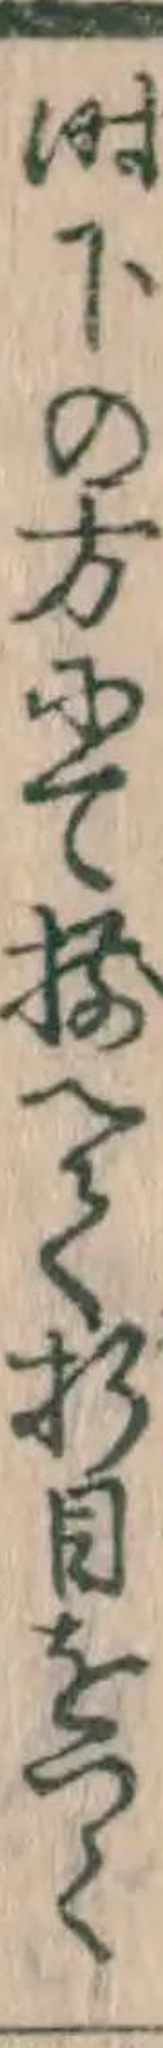時下の方にて揃へて折目をつく
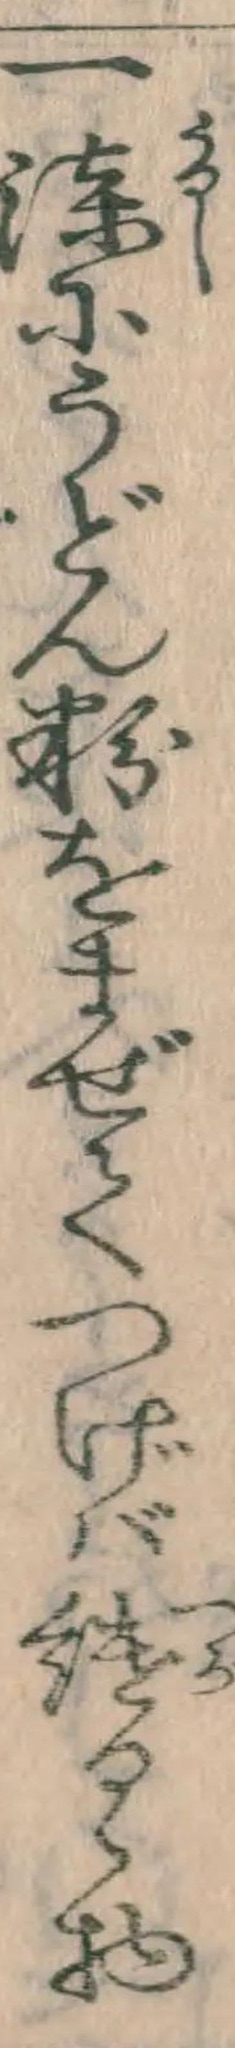一漆にうどん粉をまぜてつげば継るゝ物
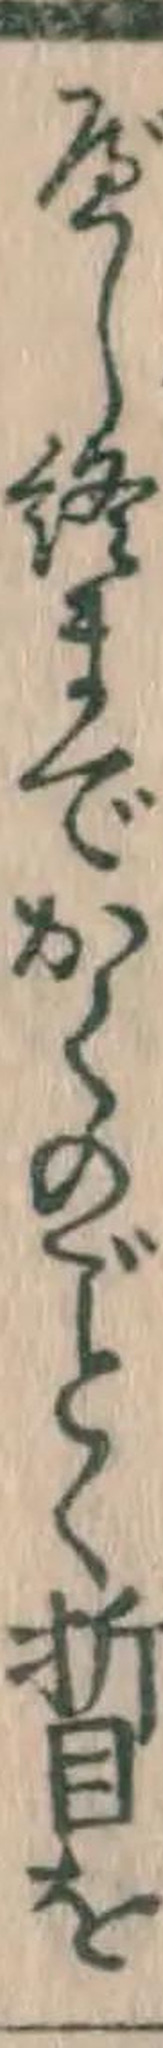べし終までかくのごとく折目を
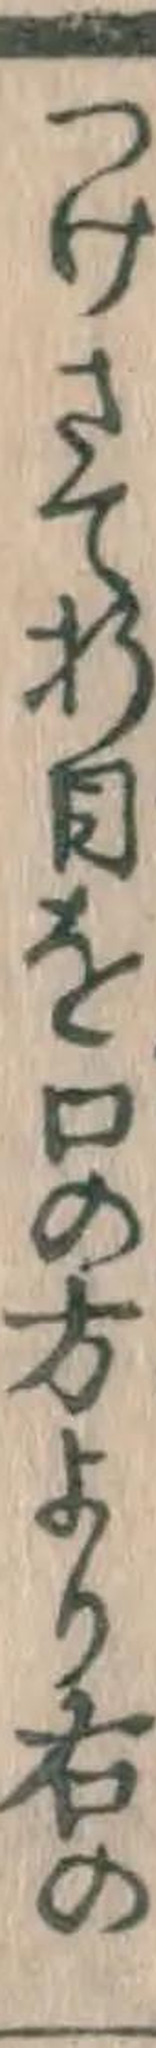つけさて折目を口の方より右の
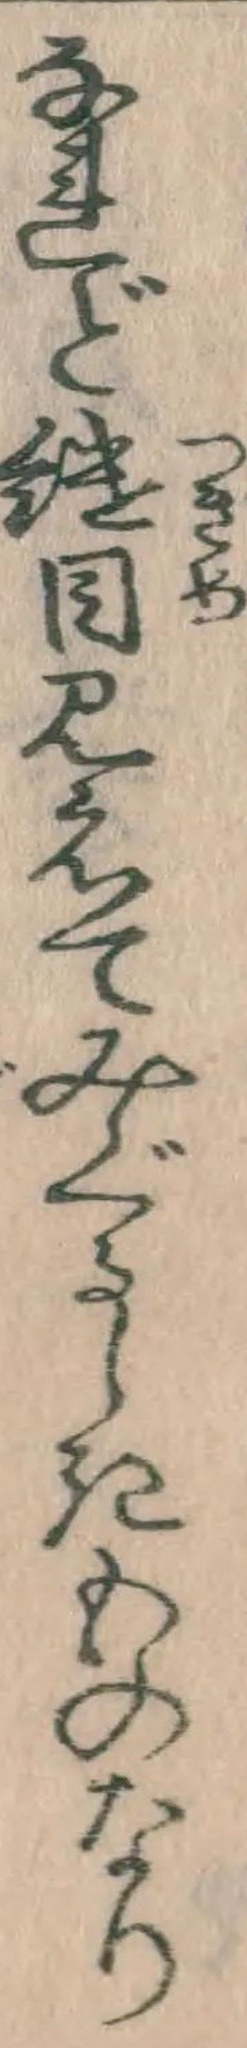なれど継目見えてみぐるしきものなり
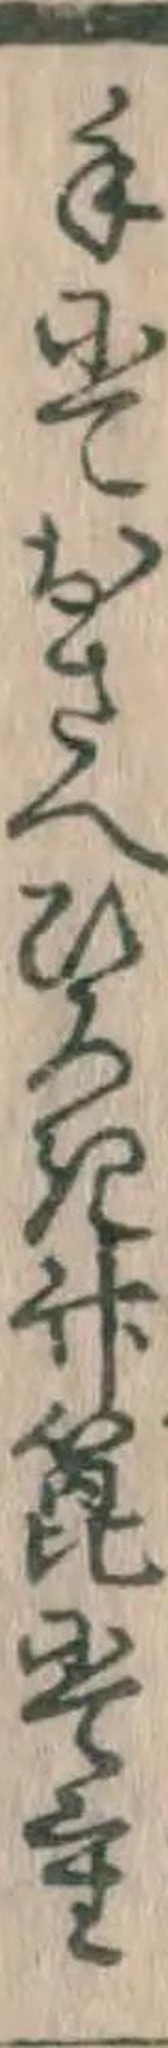手にておさへひろき竹箆にて重
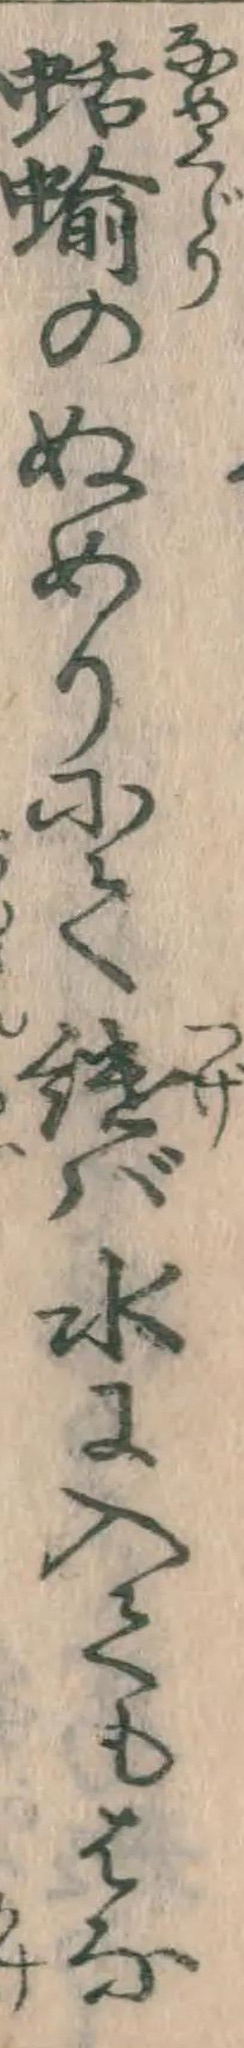蛞蝓のぬめりにて継ば水に入てもはな
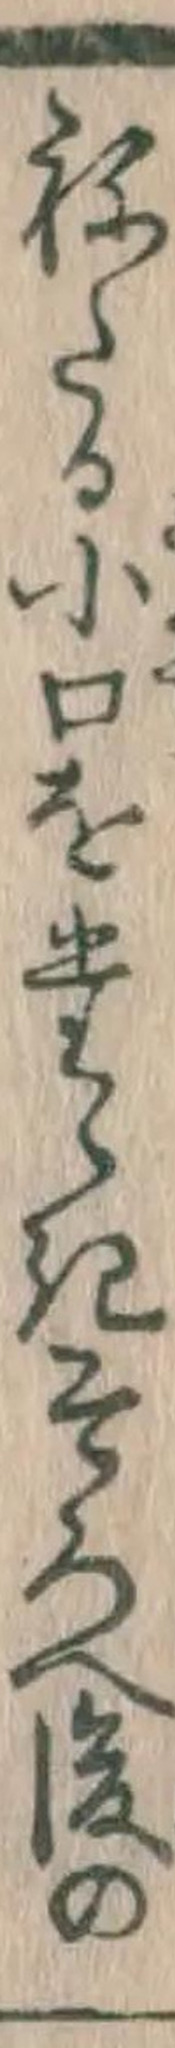ねたる小口をたゝきそろへ後の
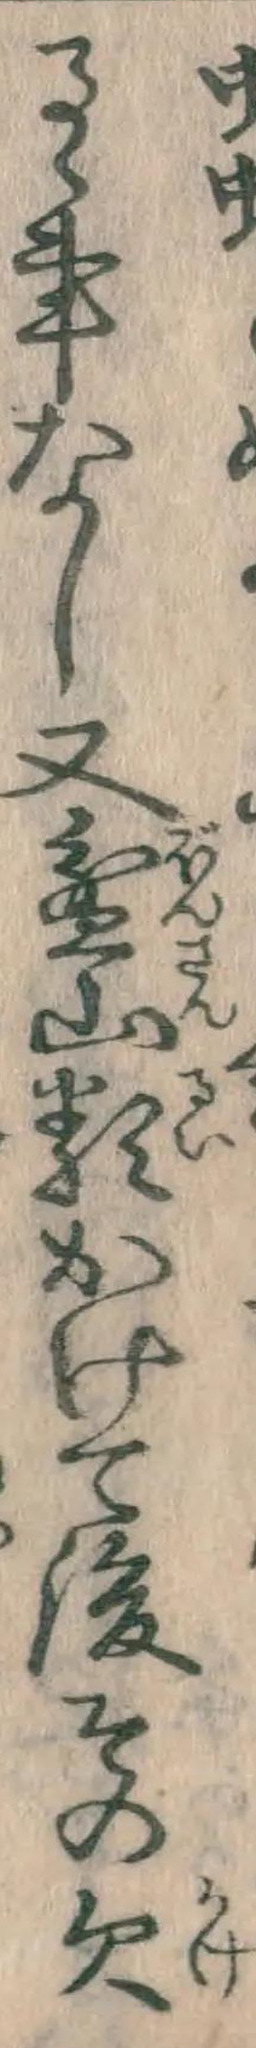るゝ事なし又盆山類かけて後その欠
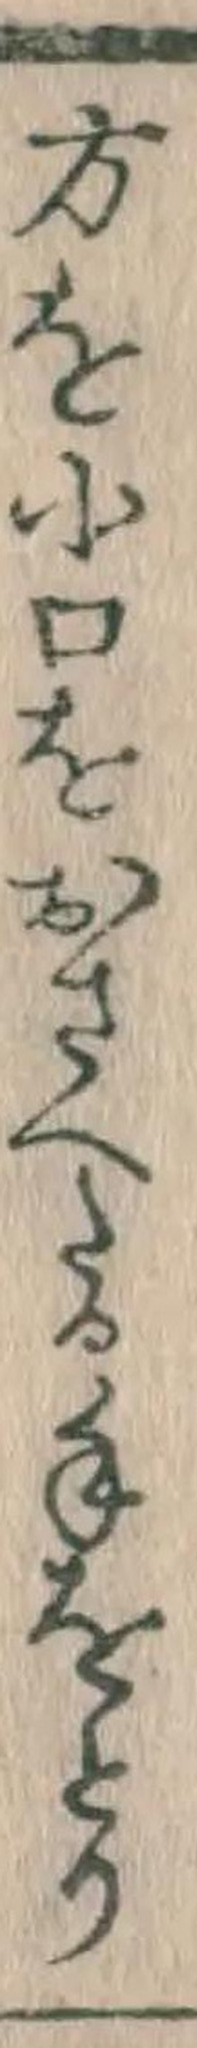方を小口をおさへたる手をとり
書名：広益秘事大全 3巻. [2]
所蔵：国立国会図書館 National Diet Library, JAPAN
